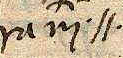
ramte .//.
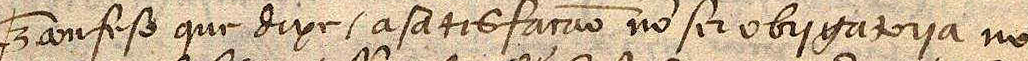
item confeso que dixe / a satisfação nō ser obrjgatorja no
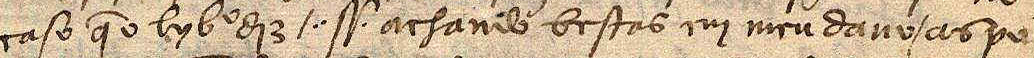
caso q̄ o lybo djz /. .ss. achando bestas em meu dano / as po
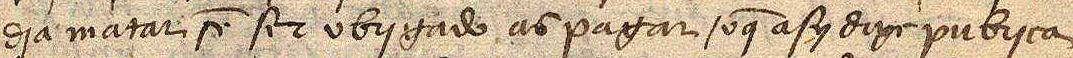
dja matar s̄e ser obrjgado as pagar / o q̄ asy dixe pubrjca
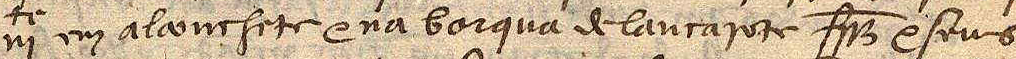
mte em alcouchete e na barqua de lancarote f̄rrz e seus
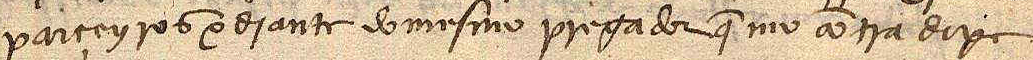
parçeyros e djante do mesmo pregador q̄ mo c̄otradixe
